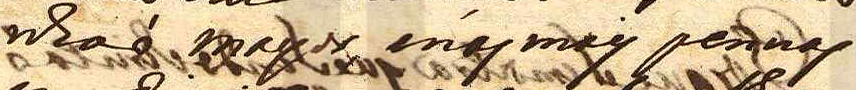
nhaõ mayor, e nas mais pennas
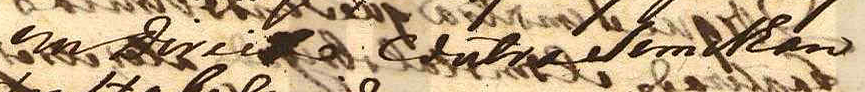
em Direito Contra Semilhan
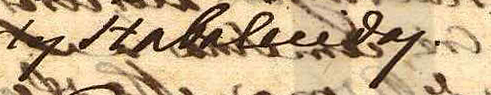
tes stabalecidas.
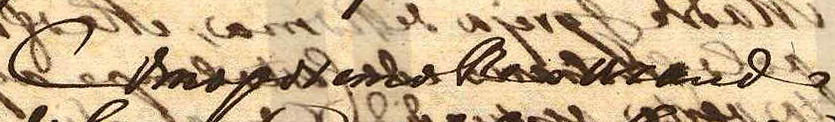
Como porem o Reo uzando
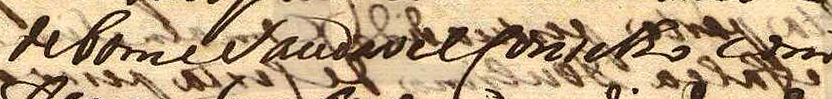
de bom e Saudavel Conselho com
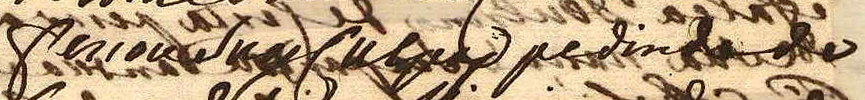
fessou suas Culpas pedindo de
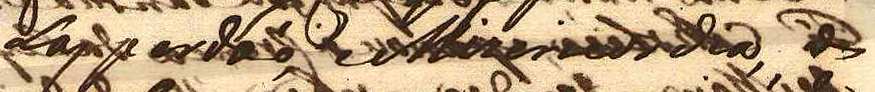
Las perdaõ, e Mizericordia, os
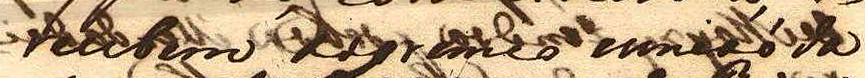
recebem ao gremeo e uniaõ da
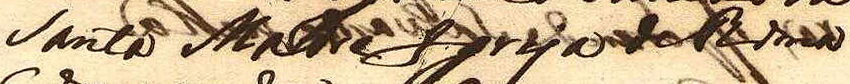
santa Madre Jgreja de Roma
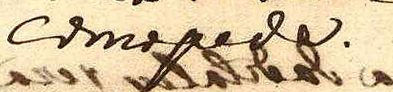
como pede.
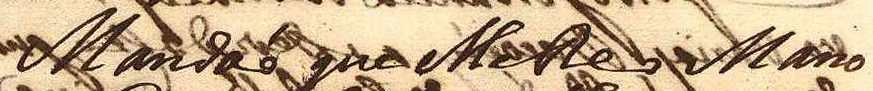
Mandaõ que elle Reo Mano
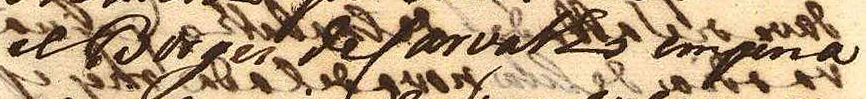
el Borges de Carvalho em pena
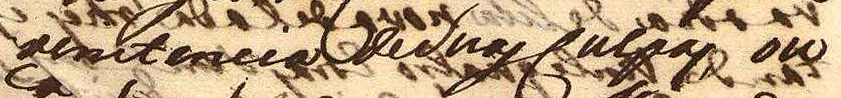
penitencia de suas Culpas, ou
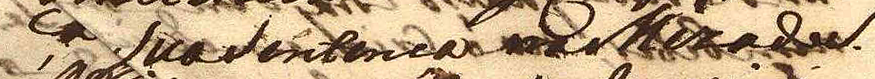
ça sua sentença na Meza do S.
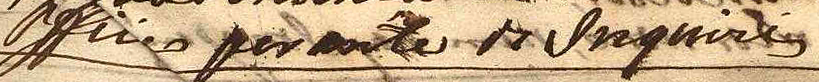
Officio perante os Inquizi
